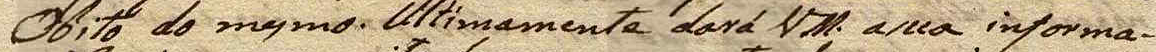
Obito do mesmo. Ultimamente dará VM. a sua informa
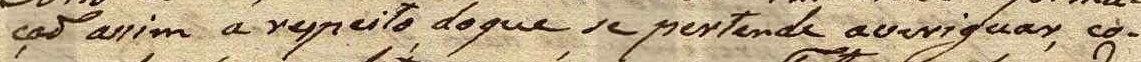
çaõ assim a respeito do que se pertende averiguar, co
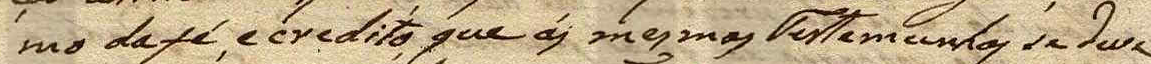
mo da fé, e credito, que ás mesmas Testemunhas se deve
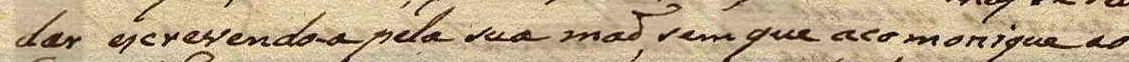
dar escrevendo-a pela sua maõ, sem que a comonique ao
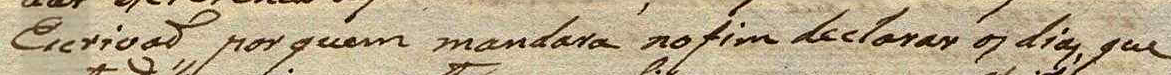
Escrivaõ, por quem mandara no fim declarar os dias, que
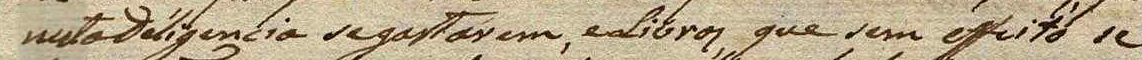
nesta deligencia se gastarem, e Livros que sem effeito se
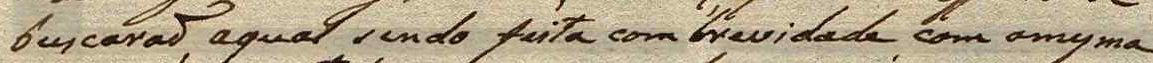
buscaraõ, a qual sendo feita com brevidade com a mesma
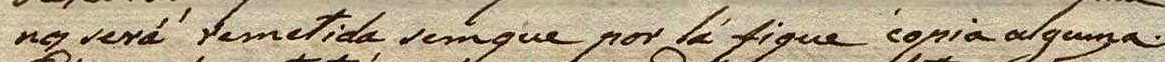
nos será remetida, sem que por lá fique copia alguma
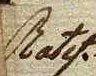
Ratef.
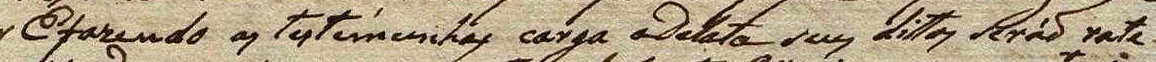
E fazendo as testemunhas carga a Delata seus dittos seraõ rate
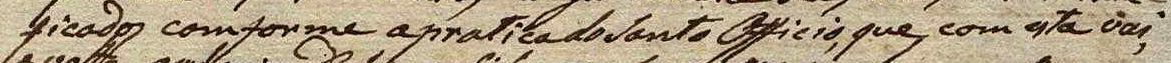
ficados comforme a pratica do Santo Officio, que com esta vai,
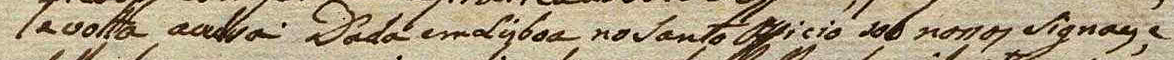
a volta a outra. Dada em Lisboa no Santo Officio sob nossos signaes, e
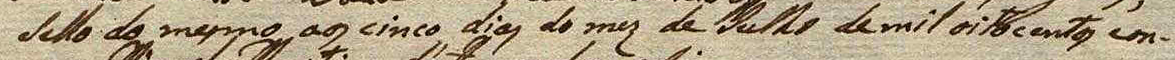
sello do mesmo aos cinco dias do mez de Iulho de mil oitocentos e on
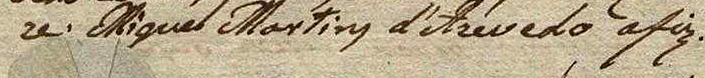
ze. Miguel Martins d'Azevedo a fiz.
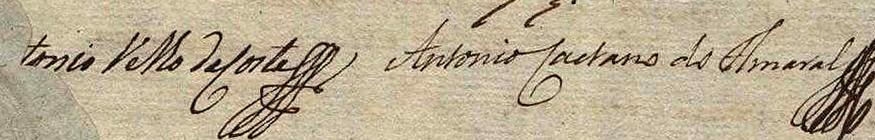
tonio Velho de Costa Antonio Caetano do Amaral
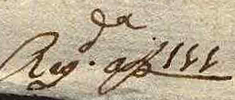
Reg.da a f 111
